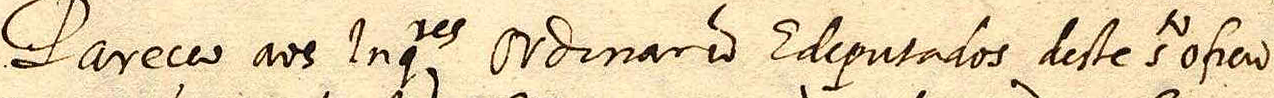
Pareçeo aos Inqres Ordinario E deputados deste sto oficio
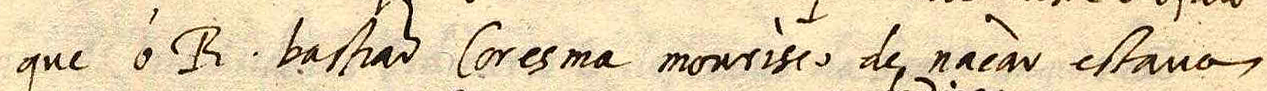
que o R. bastiaõ Coresma mourisco de nacão estaua
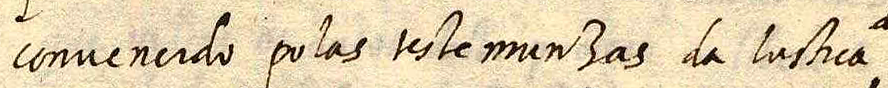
conuencido polas testemunhas da Iustica
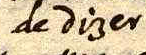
de dizer
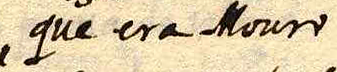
que era Mouro
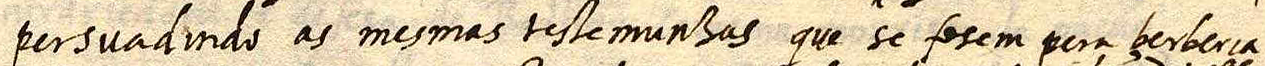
persuadindo as mesmas testemunhas que se fosem pera berberia
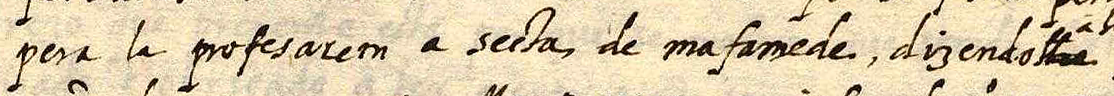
pera la profesarem a secta de mafamede, dizendolhe
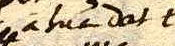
a huā das tas
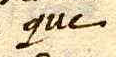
que
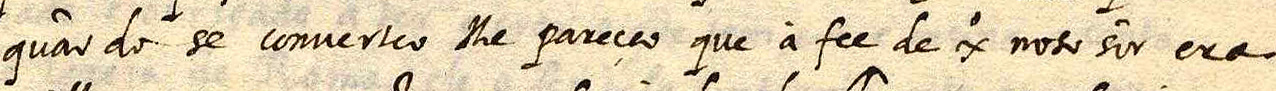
quãodo se conuerteo lhe pareçeo que à fee de xo noso sōr era
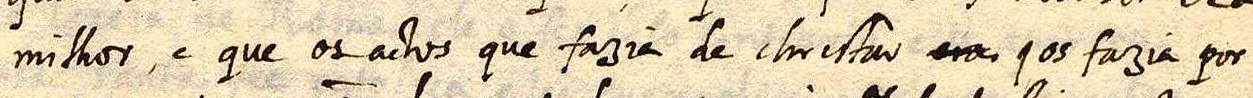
milhor, e que os actos que fazia de christão _ q os fazia por
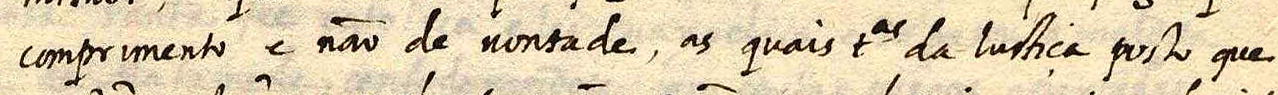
comprimento e não de uontade, as quais tas da Iustiça posto que
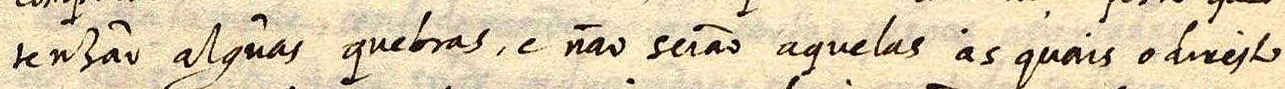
tenhão algūas quebras, e não seião aquelas as quais o direjto
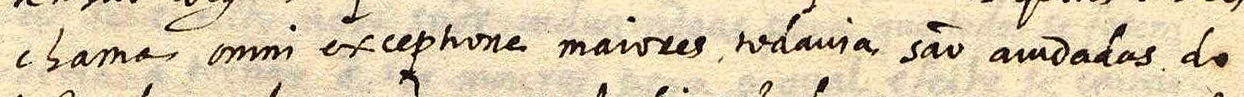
chama omni exceptione maiores, todauia são aiudadas do
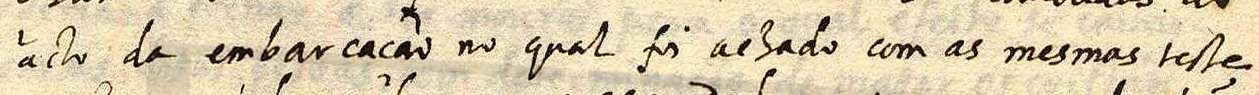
acto da embarcação no qual foi achado com as mesmas teste
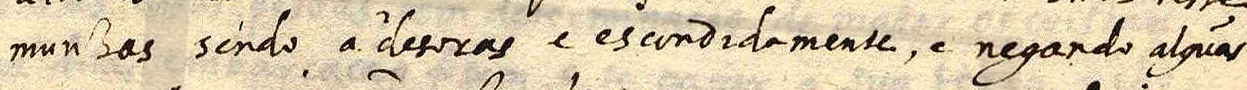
munhas sendo a desoras e escondidamente, e negando alguās
